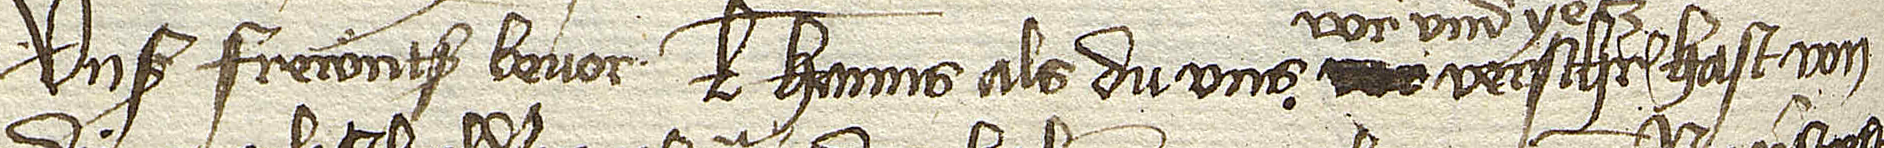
Vnſ* freẅntſ* beuor L* hanns als du vns vor verſchr* haſt von
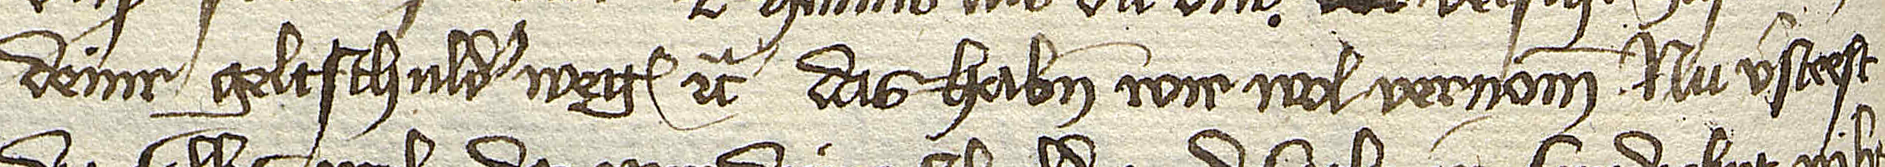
deinr geltſchuld* weg* ec* das habn* wir wol vernom* . Nu v*ſteeſt
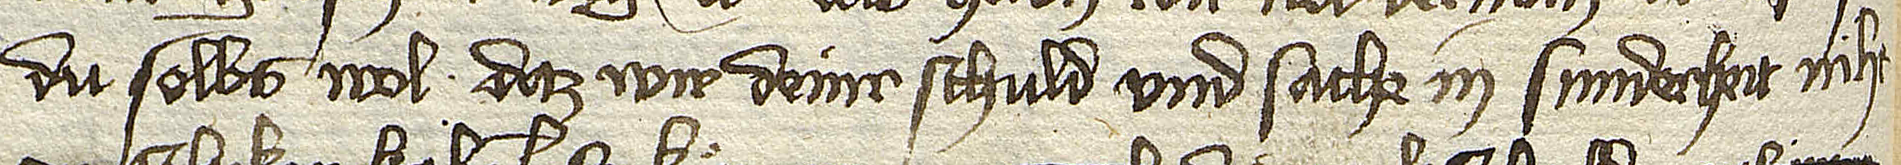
du ſelbs wol . daʒ wir deinr ſchuld vnd ſache in ſunderheit niht
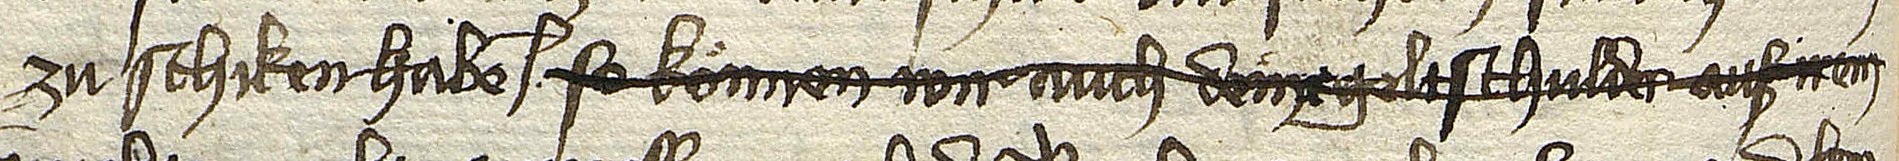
ʒu ſchiken habe* ſo können wir auch deine geltſchuldn auſʒ irem
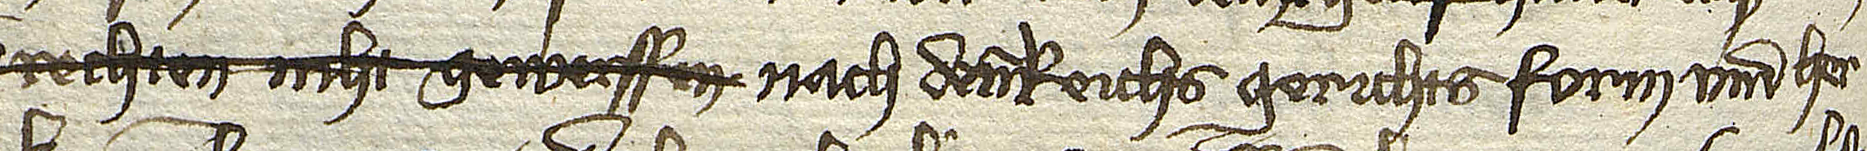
rechten niht gewerffen nach dem Reichs gerichts form vnd her
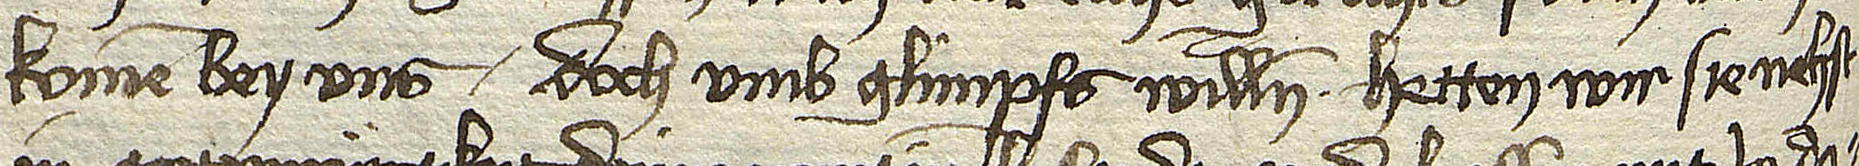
kome* bey vns / Doch vmb glimpfs willn* . hetten wir ſie nehſt
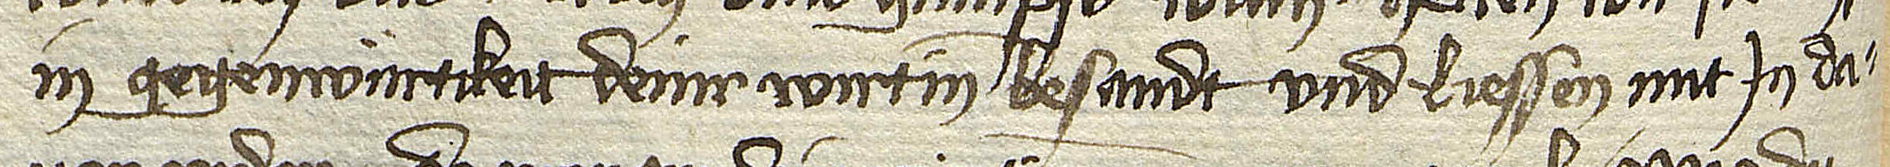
in gegenwürtikeit deinr wirtin* beſandt vnd lieſſen mit In da =
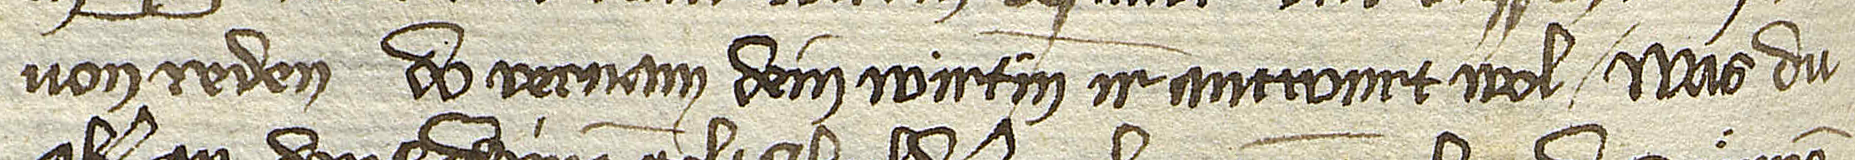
uon reden do vernam dein wirtin* ir antwurt wol / was du
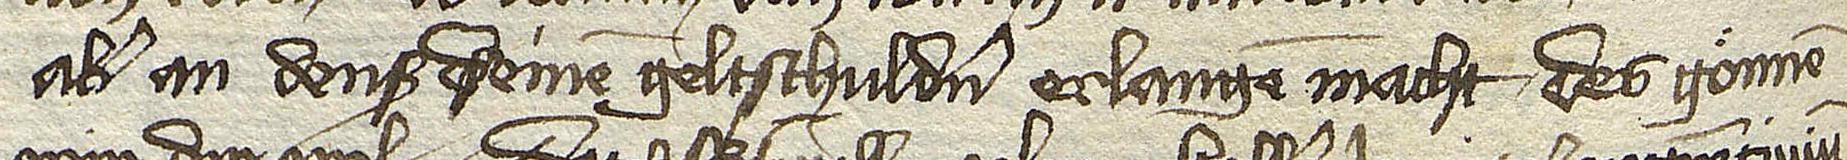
ab* an denſ* deine* geltſchuldn* erlange* macht / Des gönne*
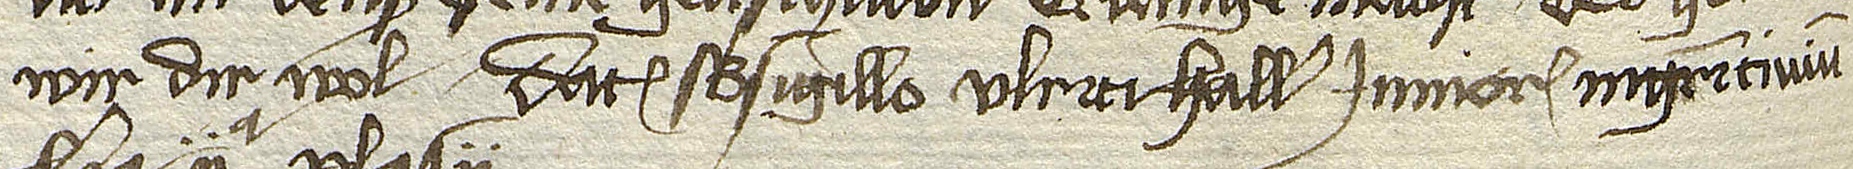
wir dir wol / Dat* ſ*ſigillo vlrici hall* Iunior* mgri*ciuiu*
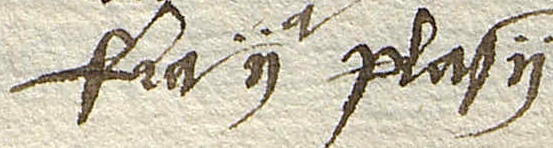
fi*a ii* plaſii
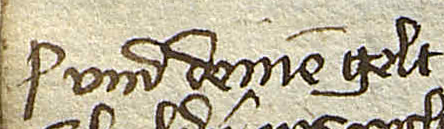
vnd deine* gelt
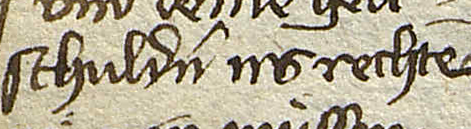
ſchuldn* irs rechte*
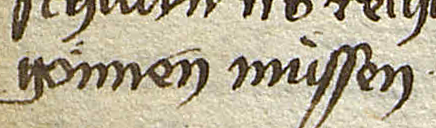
gönnen müſſen
